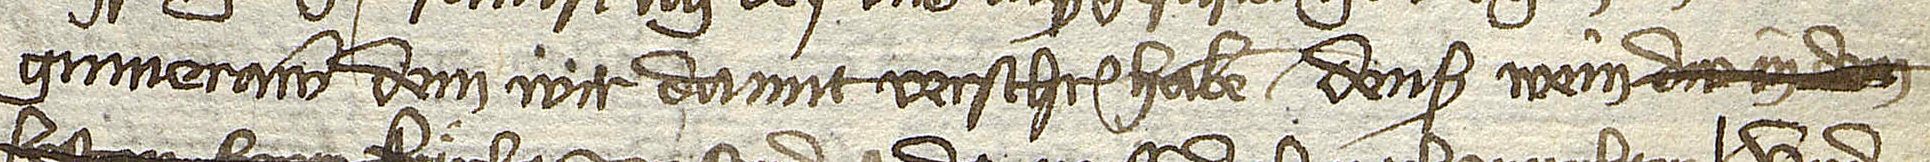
gumeraw* dem wir damit verſchr* habe* / denſ* wein dir in dem
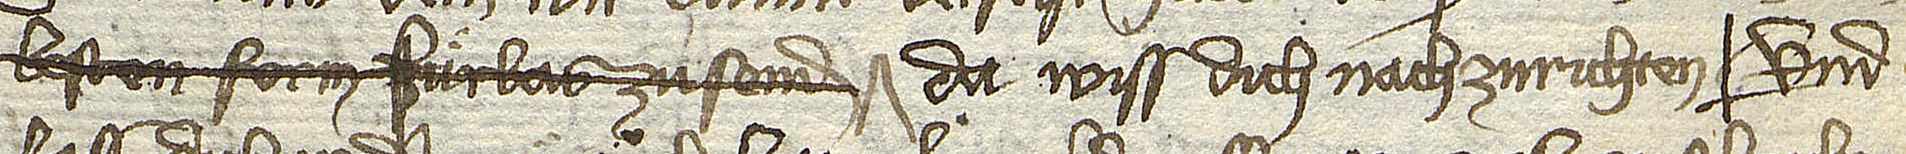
beſten form fürbas ʒu ſend* da wiſſ dich nach ʒurichten Vnd
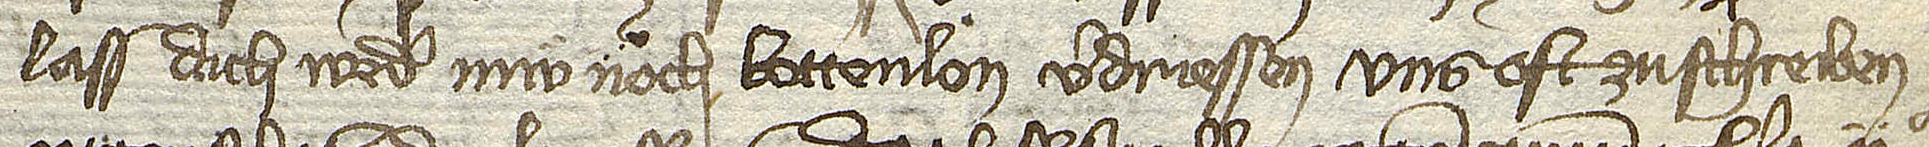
laſſ dich wed* mw noch bottenlon v*drieſſen vns oft ʒuſchreiben
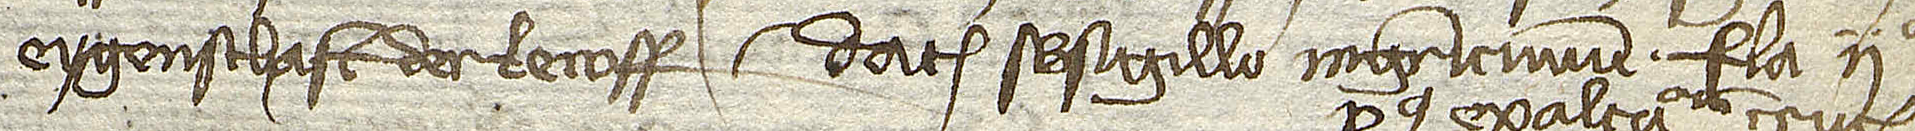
eygenſchaft der lewff / dat* ſB* ſigillo m*g*riciuiu* . fia* ii*
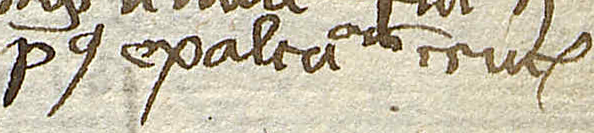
p* exalta* cruc*
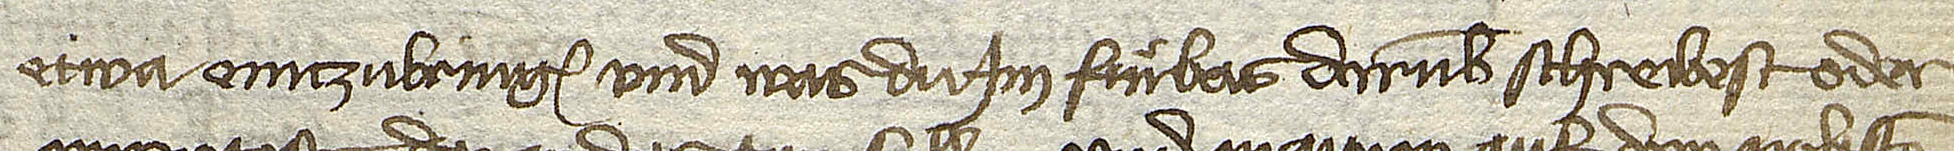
etwa eincʒubring* vnd was du Im fürbas darub* ſchreibeſt oder
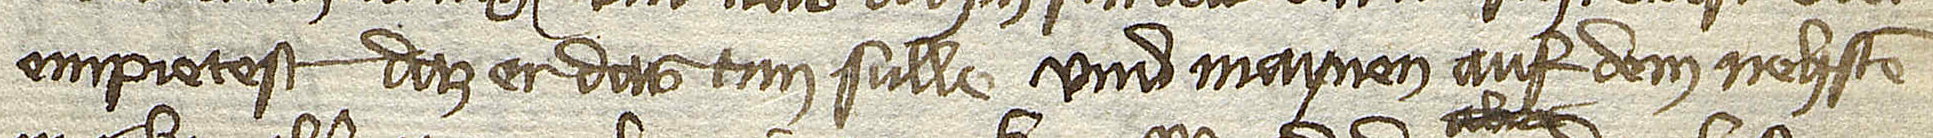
empieteſt daʒ er das tun ſülle vnd maynen auf dem nehſte*
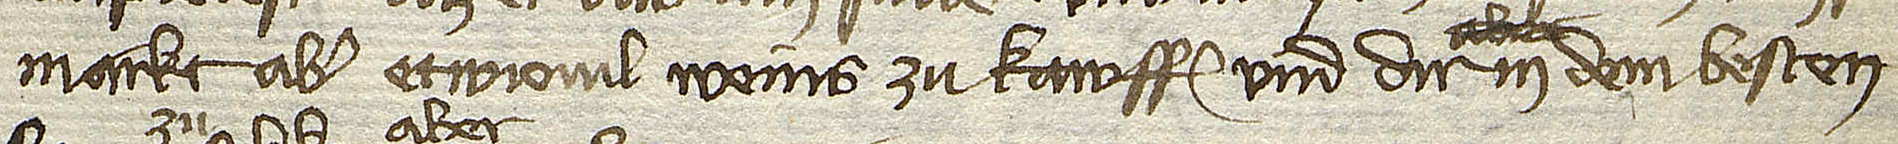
markt ab* etwievil weins ʒu kawff* vnd dir in dem beſten
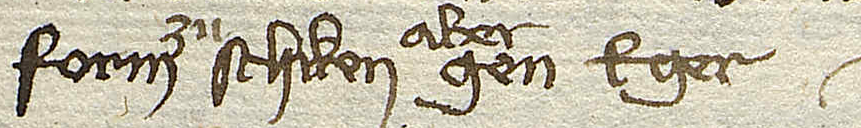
form ſchiken gen Eger /
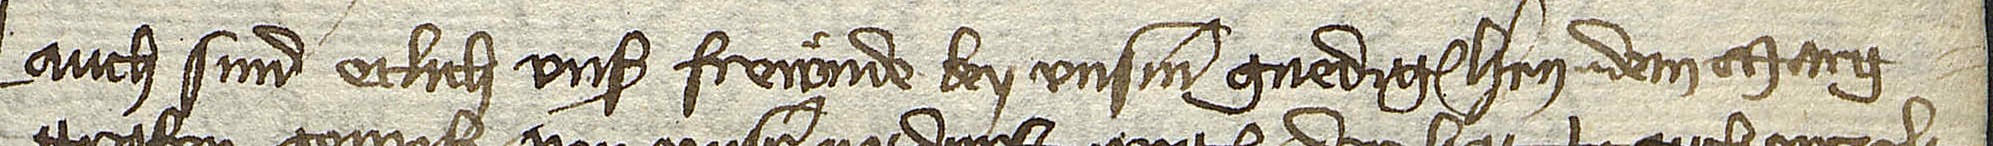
auch ſind etlich vnſ* frewnde bey vnſ*m gnedig* h*ren ~ dem Marg =
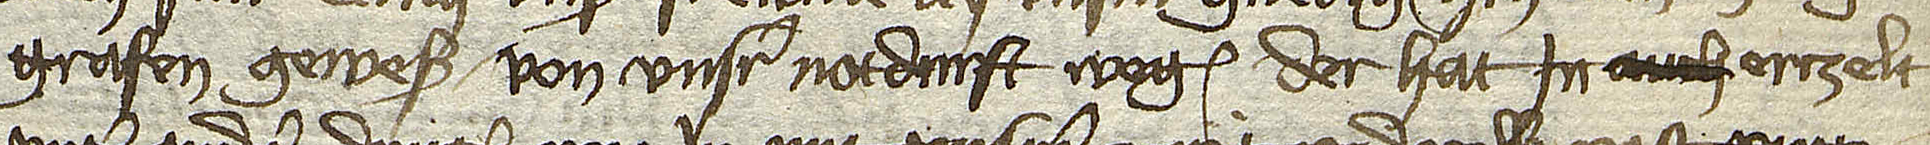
grafen geweſ* / von vnſ*r notdurft weg* / der hat In auch ercʒelt
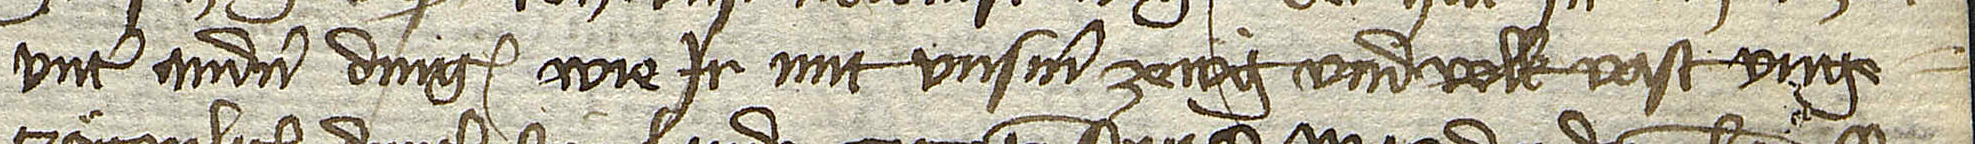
vnt* and*n ding* wie Ir mit vnſ*m ʒewg vnd volk vaſt vnge =
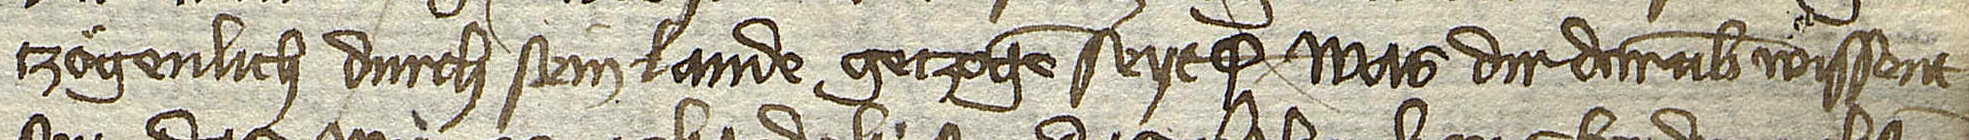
cʒögenlich durch ſein lande gecʒoge* ſeyt was dir darub* wiſſent
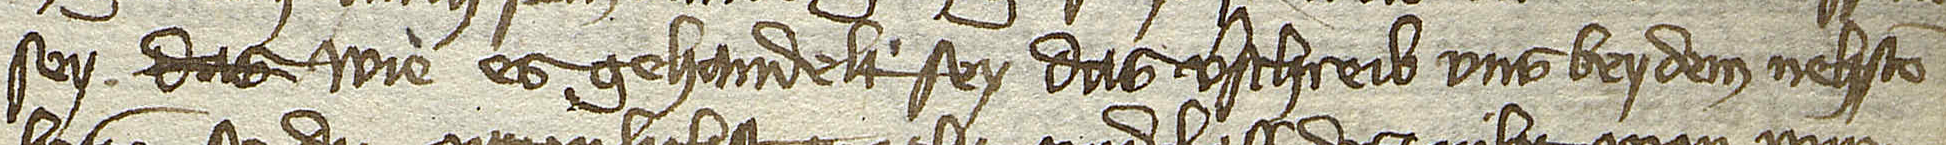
ſey . das wie es gehandelt ſey das v*ſchreib vns bey dem nehſte*
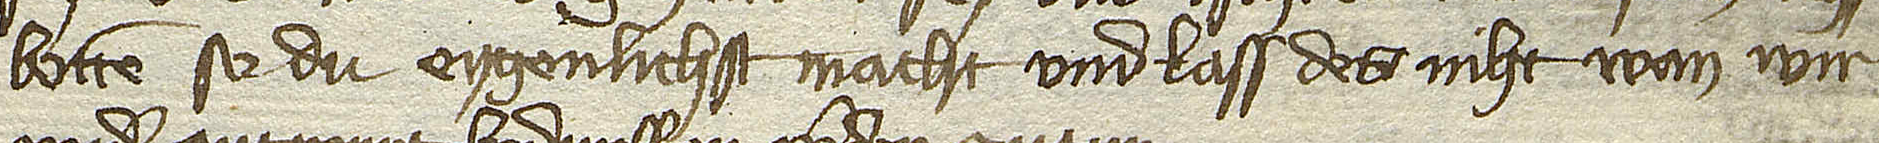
botte* ſo du eygenlichſt macht vnd laſſ des niht wan wir
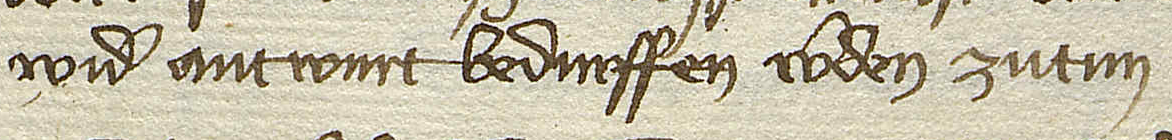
wid* antwurt bedurffen w*den ʒutun
